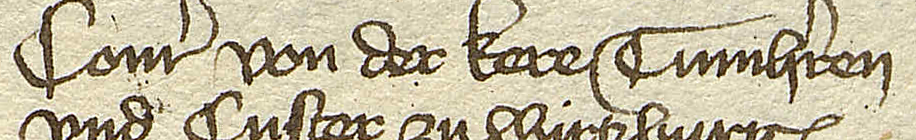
Conr* von der kere Tumhr*en
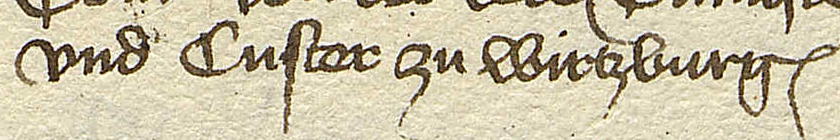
vnd Cuſter cʒu wircʒburg*
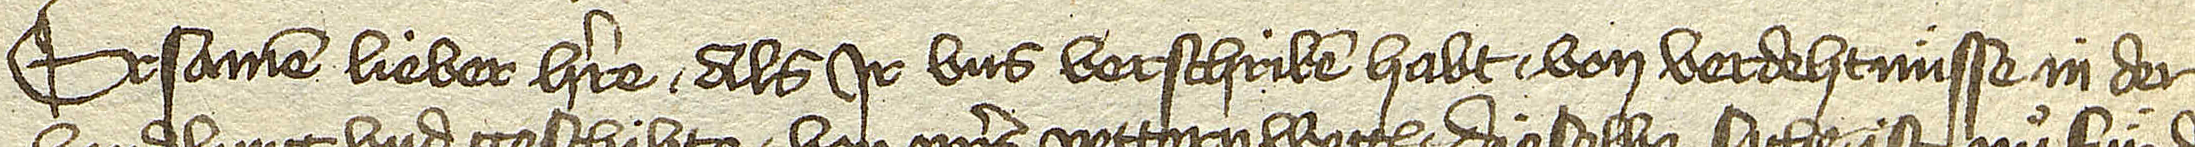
Erſame* lieber h*re / Als Ir vns verſchribe* habt / von verdehtnüſſe in der
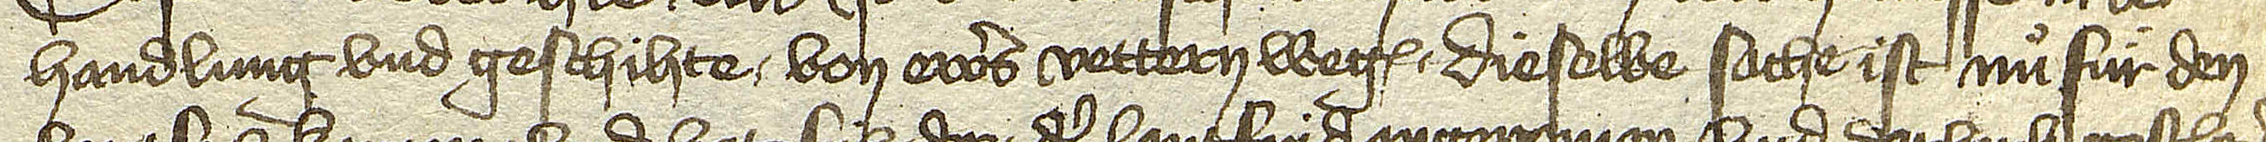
handlung vnd geſchichte / von ews* vettern weg* / dieſelbe ſache iſt nü für den
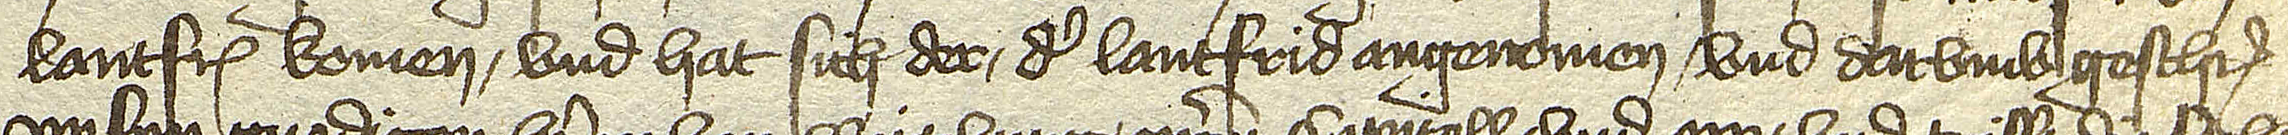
lantfr* komen / vnd hat ſich der / d* lantfrid angenomen / vnd darvmb geſchr*
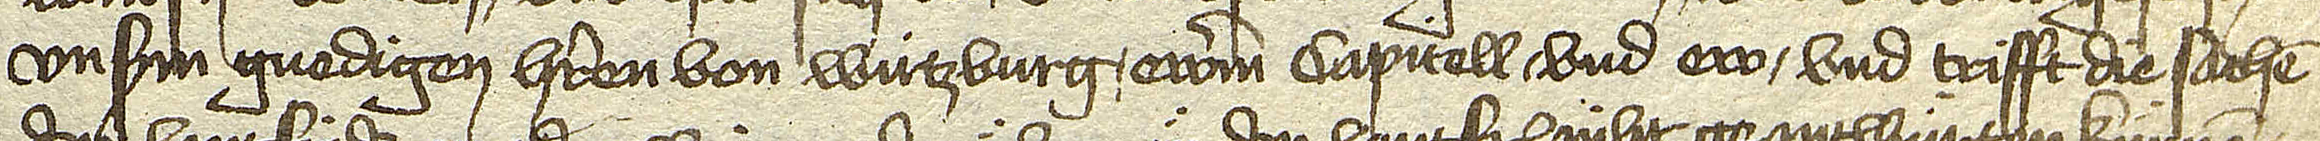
vnſ*m gnedigen hr*en von wircʒburg / ew*m Capitell / vnd ew / vnd trifft die ſache*
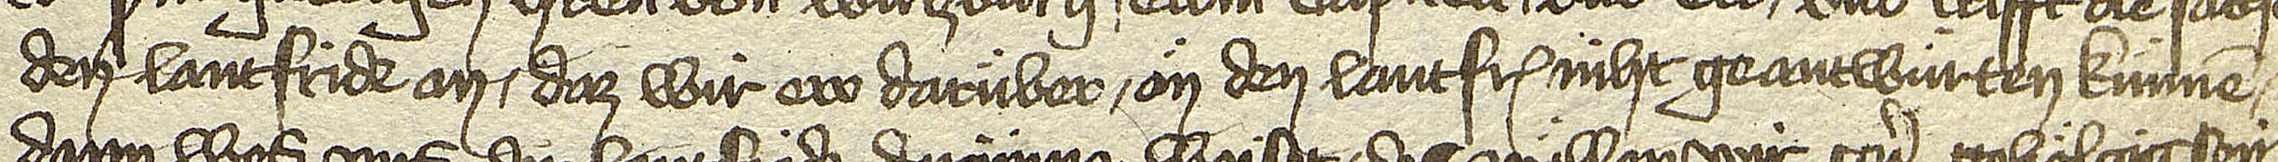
den lantfride an / daʒ wir ew darüber / ön den lantfr* niht geantwürten künne* /
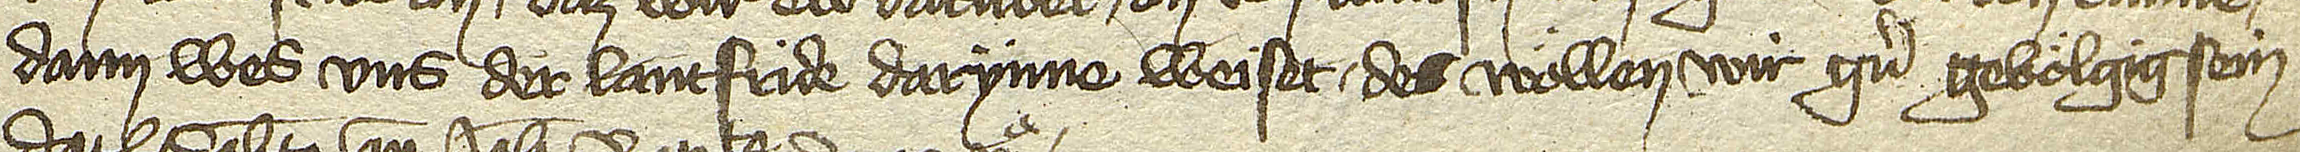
dann wes vns der lantfride darynne weiſet / des wöllen wir gn* gevölgig ſein
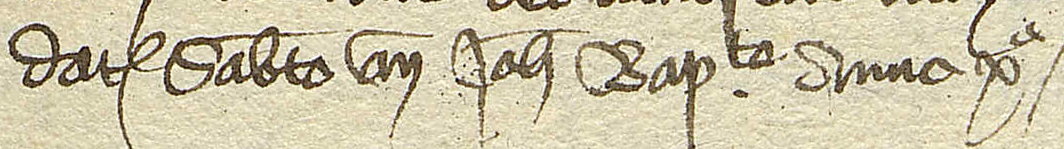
dat* Sabto* an* Ioh* Bap* . Anno x* /
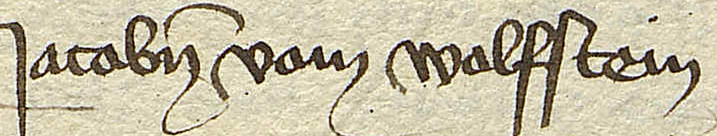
Iacobn* vom wolfſtein
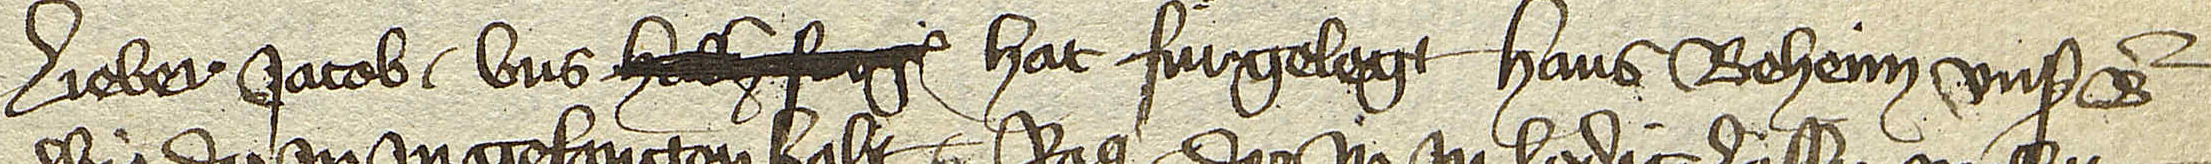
Lieber Iacob / vns habn* fürg* hat fürgelegt hans Beheim vnſ* B*
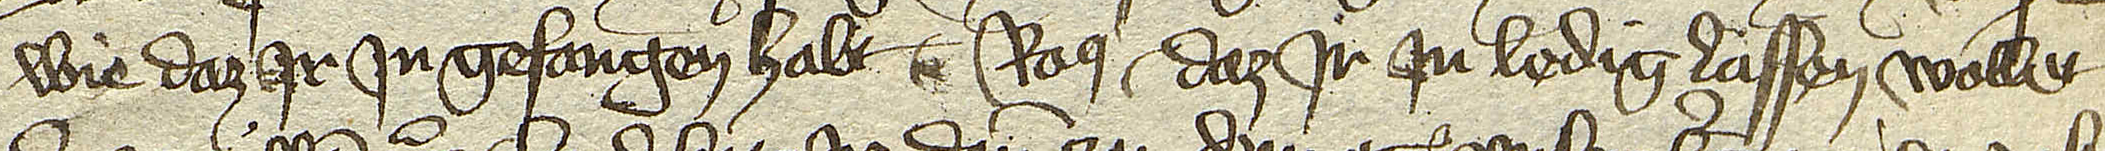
wie daʒ Ir In gefangen habt / Ro* / daʒ Ir In ledig laſſen wollet
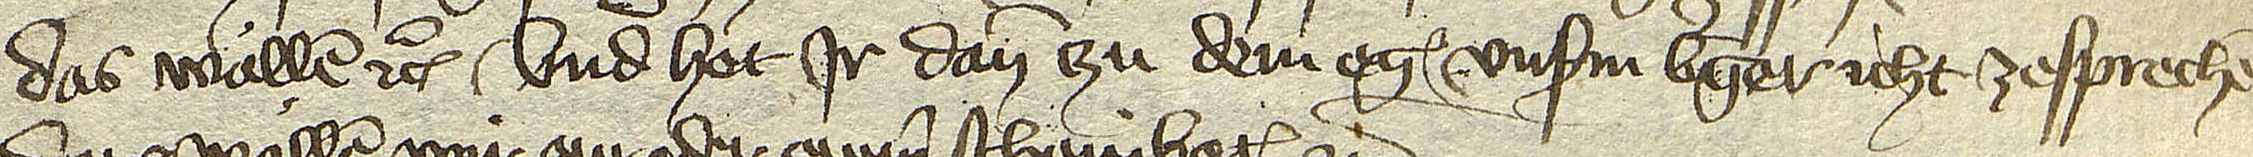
das wölle* ec* / vnd het Ir dan* cʒu dem eg* vnſ*m b*ger icht cʒeſpreche*
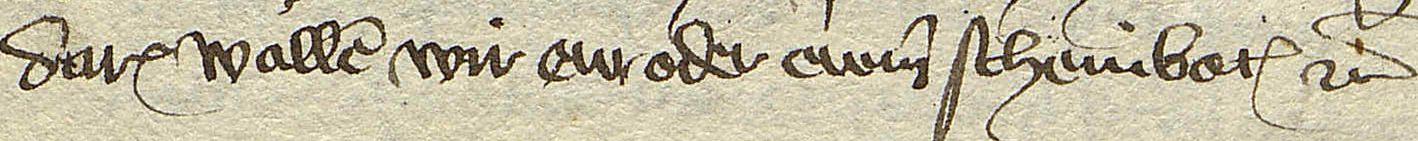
dar* wölle* wir ew / oder ewn* ſcheinbot* ec*
